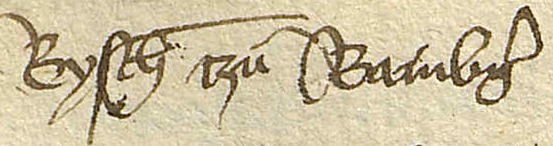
Byſch* cʒü Bambg*
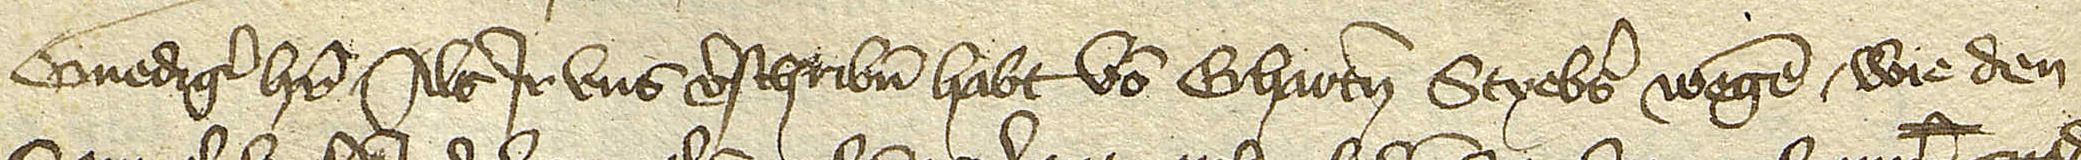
Gnedig* hr* / Als Ir vns v*ſchribn* habt vo* Erhartn* Styebs* wege* / wie den
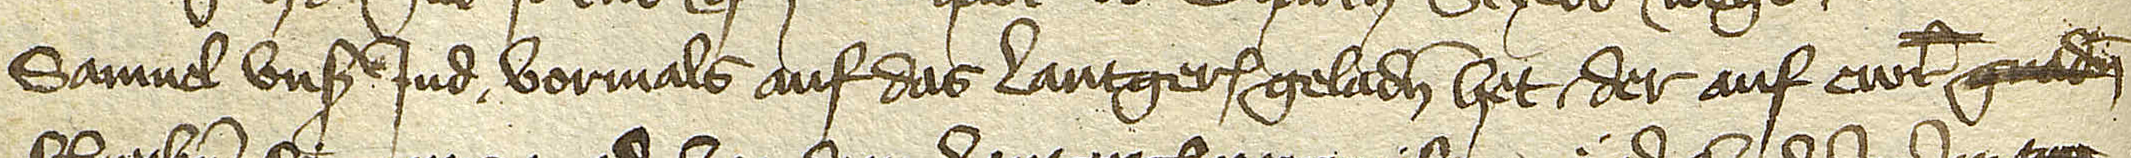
Samuel vnſ* Iud vormals auf das Lantger* geladn* het / der auf ewr* gnadn*
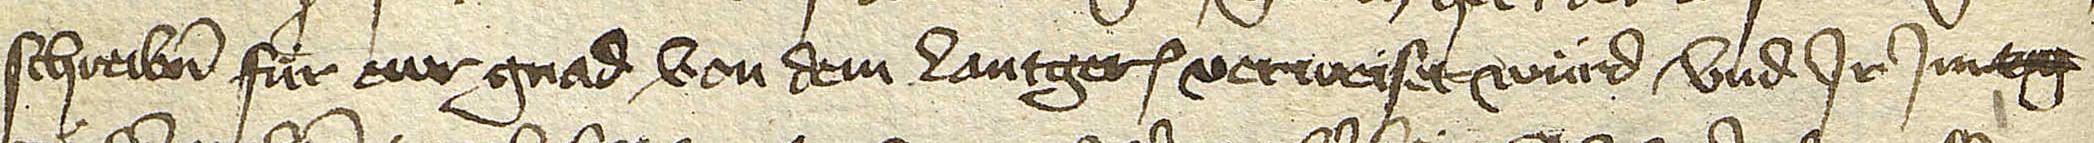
ſchreibn* für ewr gnad von dem Lantger* verweiſet würd / vnd Ir Im tag
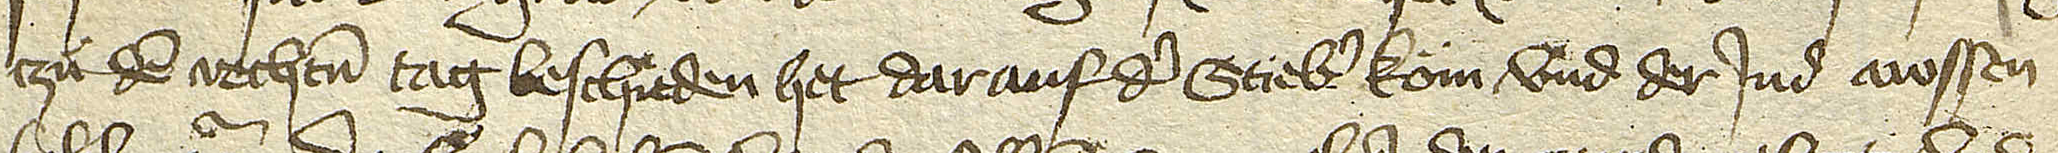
cʒü d* rechtn* tag beſchieden het darauf d* Stieb* köm / vnd der Iud awſſen
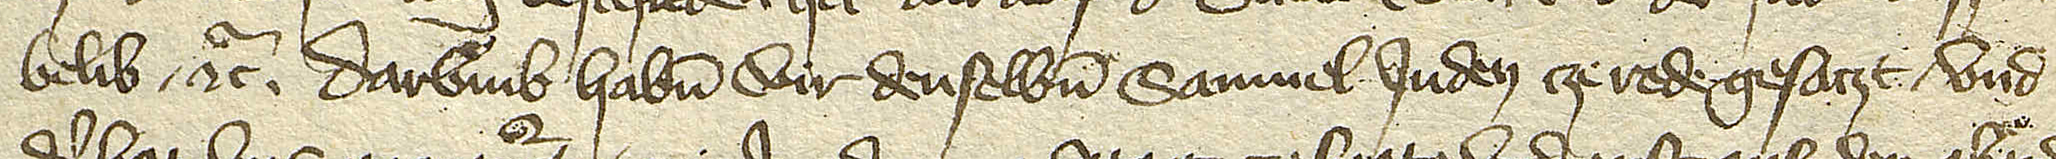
belib / ec* . darvmb habn* wir denſelbn* Samuel Iuden cʒe rede geſacʒt / vnd
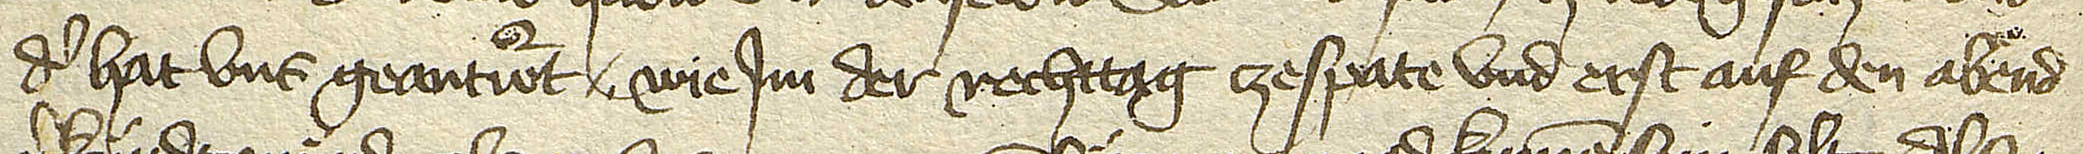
d* hat vns geantw*t / . wie Im der rechttag cʒeſpate vnd erſt auf den abend
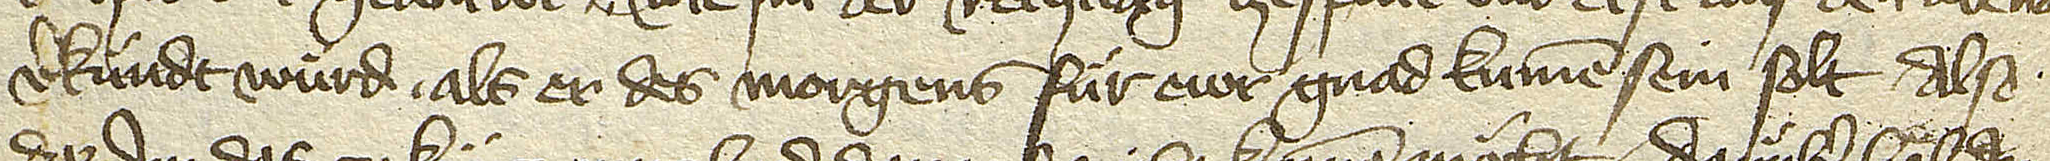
v*kündt würd / als er des morgens für ewr gnad kume* ſein ſolt / Alſo
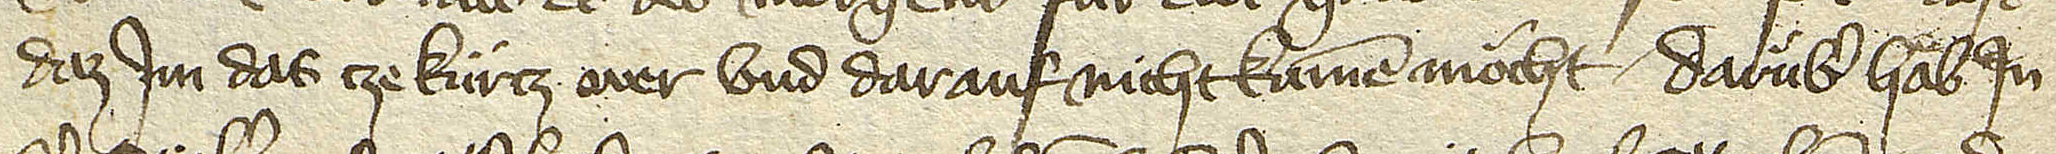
daʒ Im das cʒe kürcʒ wer vnd darauf nicht kume* möcht / darüb* hab In
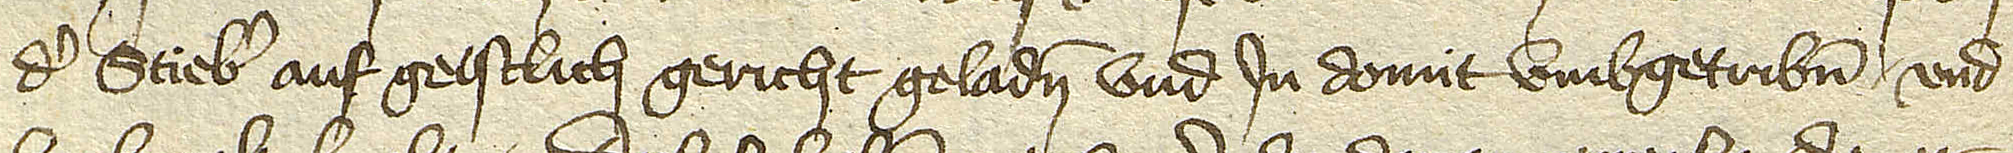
d* Stieb* auf geiſtlich gericht geladn* vnd In domit vmbgetribn* / vnd
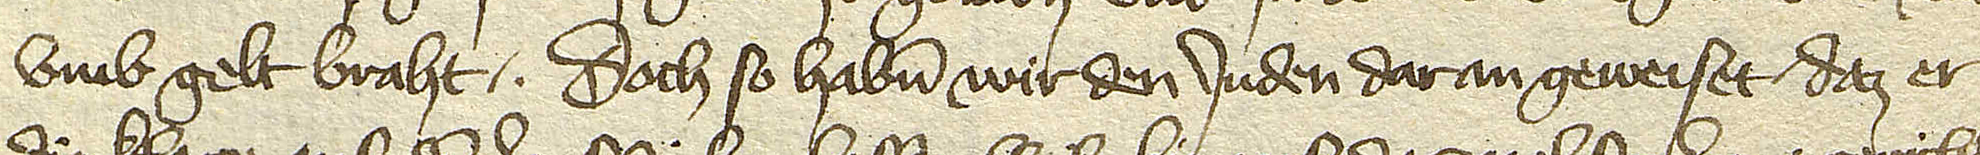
vmb gelt braht / . Doch ſo habn* wir den Iuden daran geweiſet / daʒ er
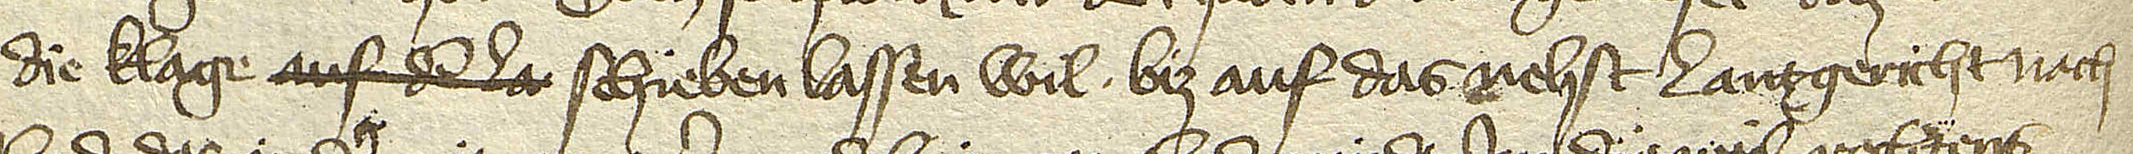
die klage auf d* La ſchieben laſſen wil . biʒ auf das nehſt Lantgericht nach
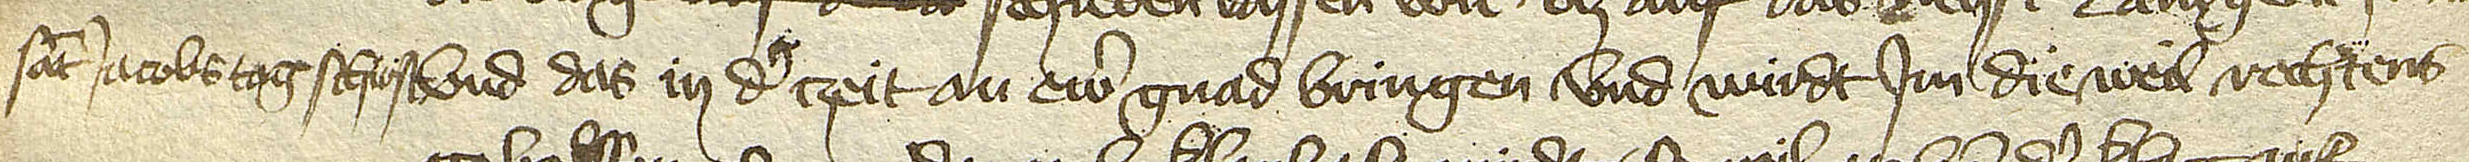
ſa*t Iacobs tag ſchirſt vnd das in d* cʒeit an ew* gnad bringen / vnd wirdt Im die weil rechtens
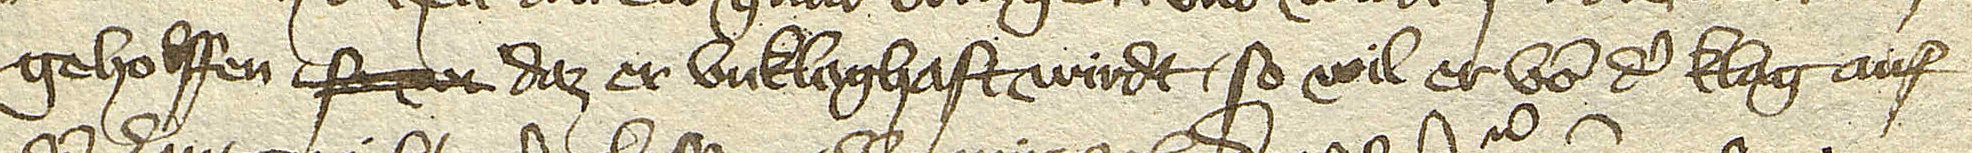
geholffen ſo wi daʒ er vnklaghaft wirdt / ſo wil er vo* d* klag auf
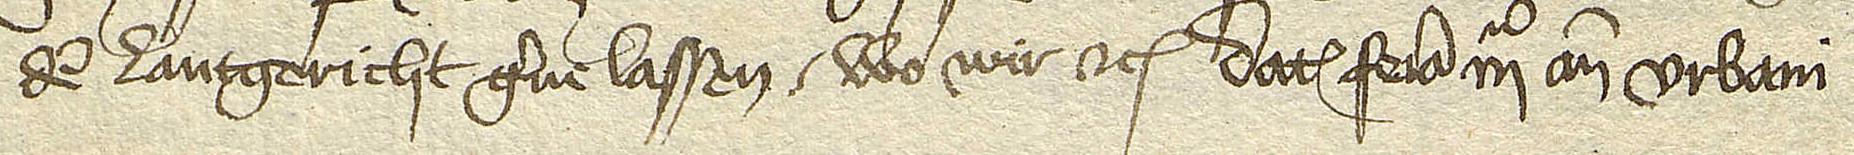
d* Lantgericht g*ne laſſen / wo wir ec* Dat* feia* iii* an* vrbani
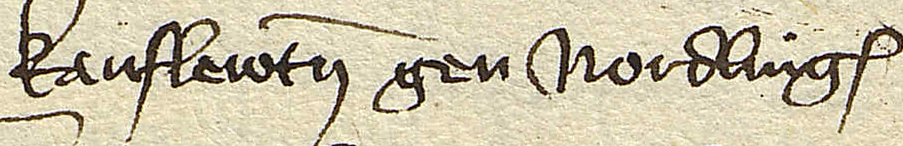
Kauflewtn* gen Nordling*
